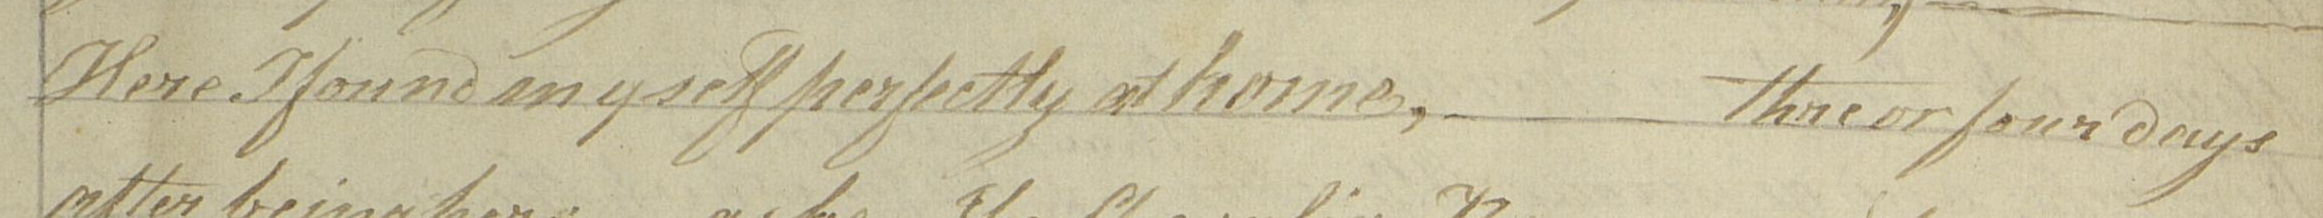Here I found my self perfectly at home, Thre or four days
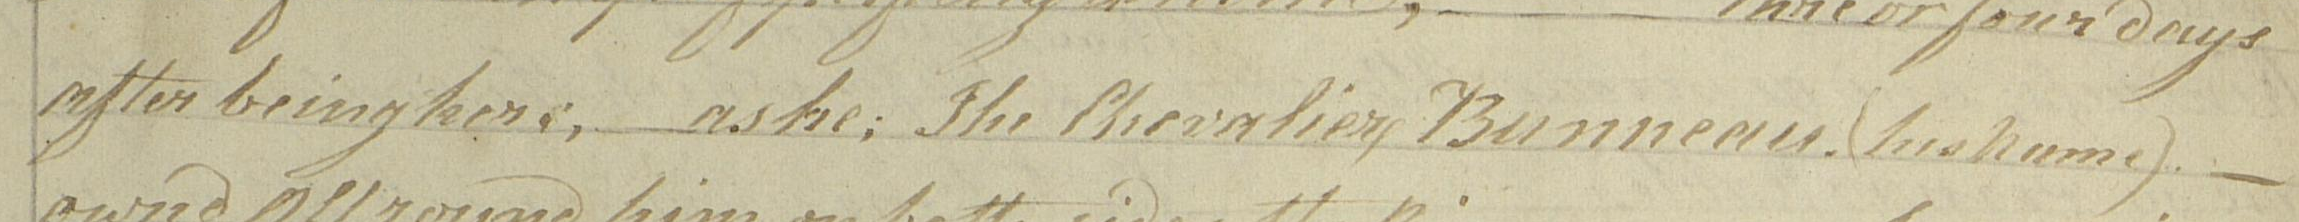after being here, as he; The Chevalier Bunneau (Irishume).
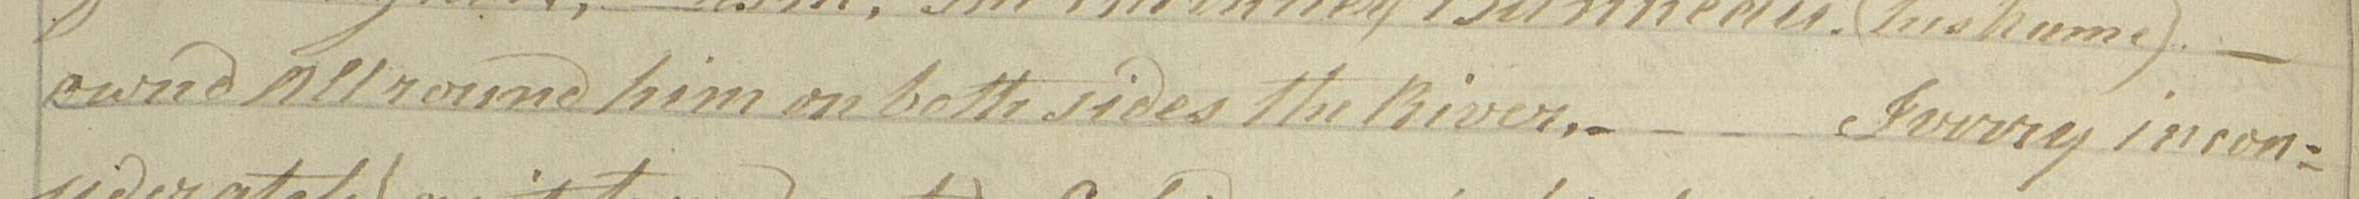carid All round him on both sides the River. I verry incon-
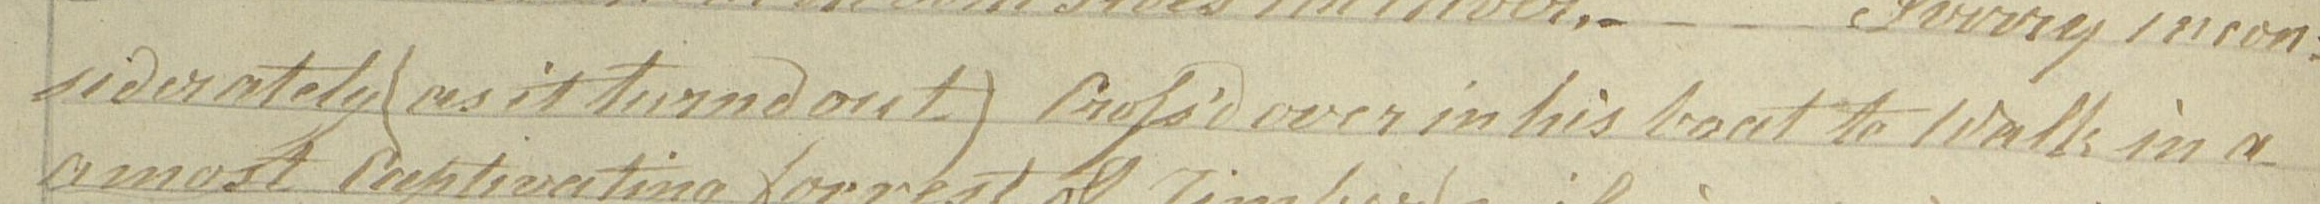-siderately (as it turnd out) Cross'd over in his boat to walk in a
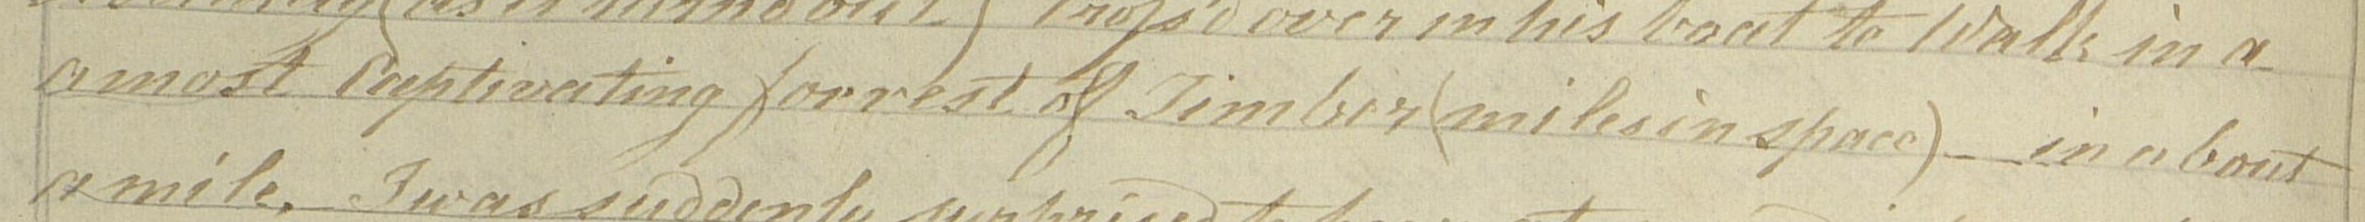a most Captivating forrest of Timber (miles in space) in a bout
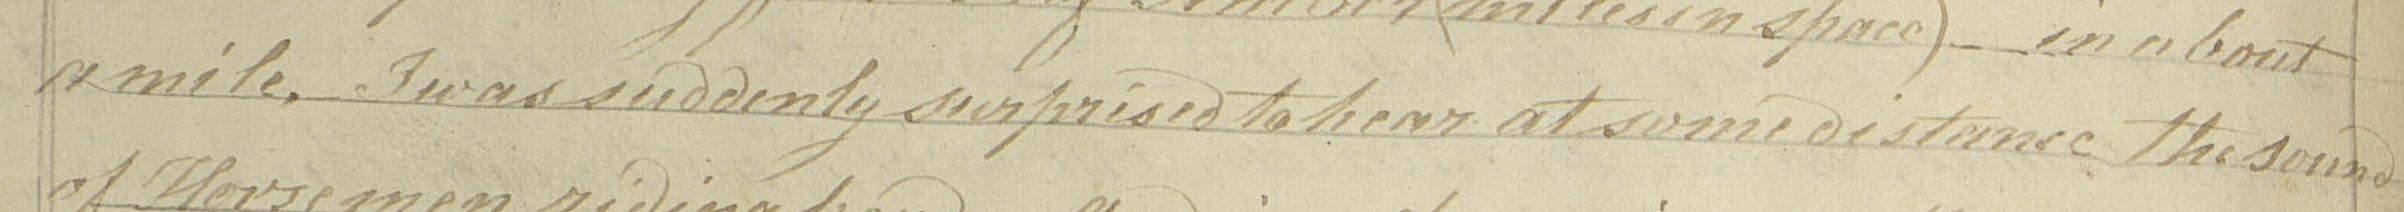a mile, I was suddenly surprised to hear at some distance the sound
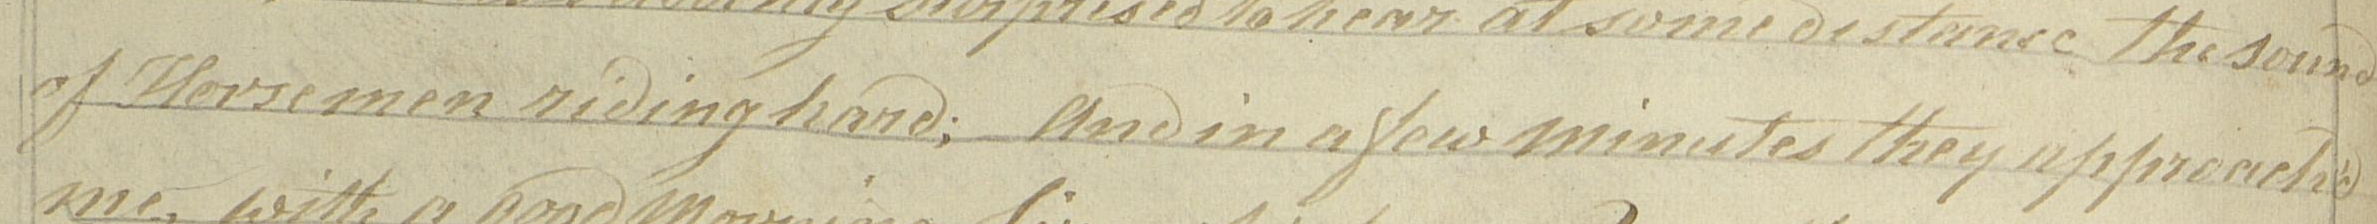of Horsemen riding hard; And in a few minutes they approach'd
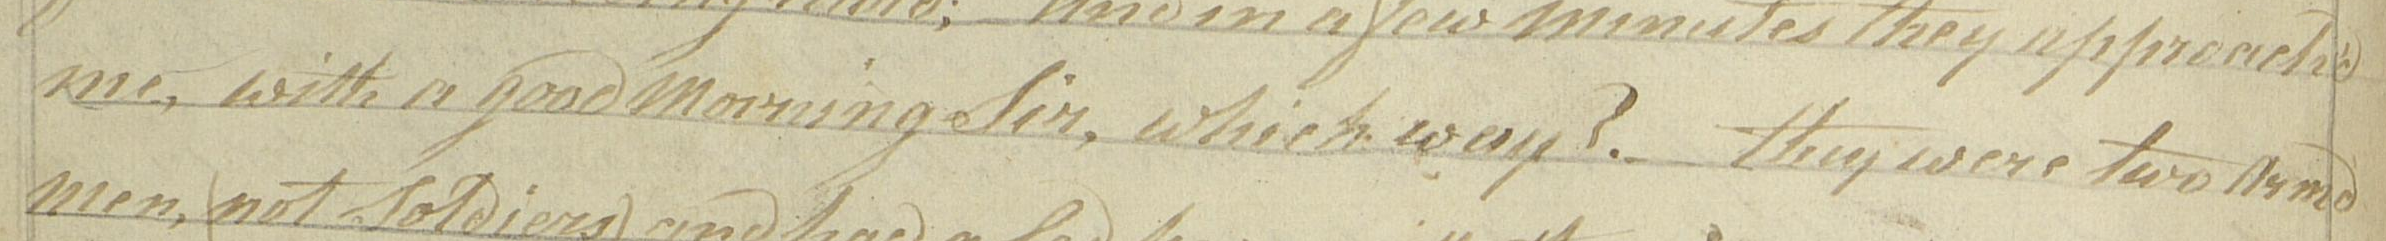me, with a good morning Sir, which way? they were two Armd
